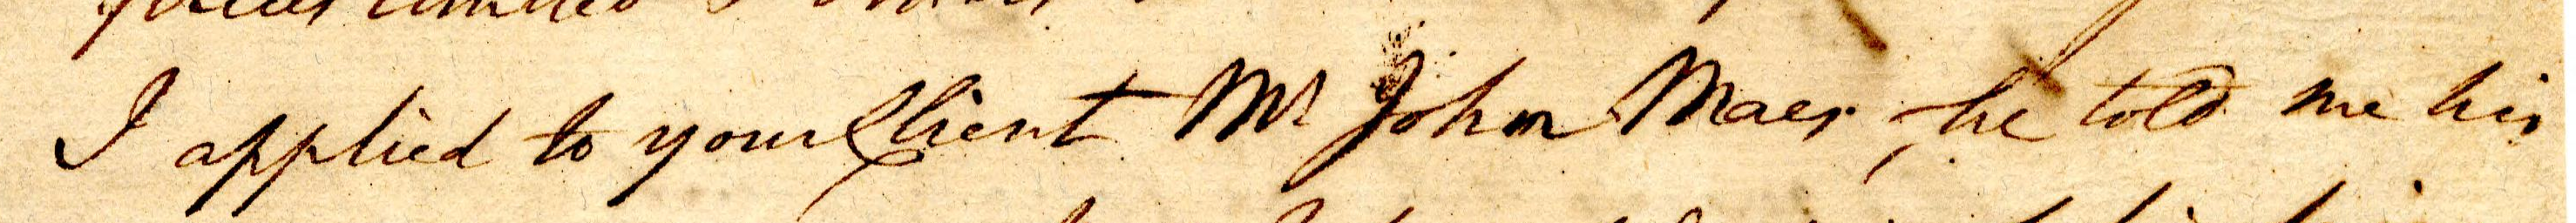I applied to your Client M^r.John Maes he told me his
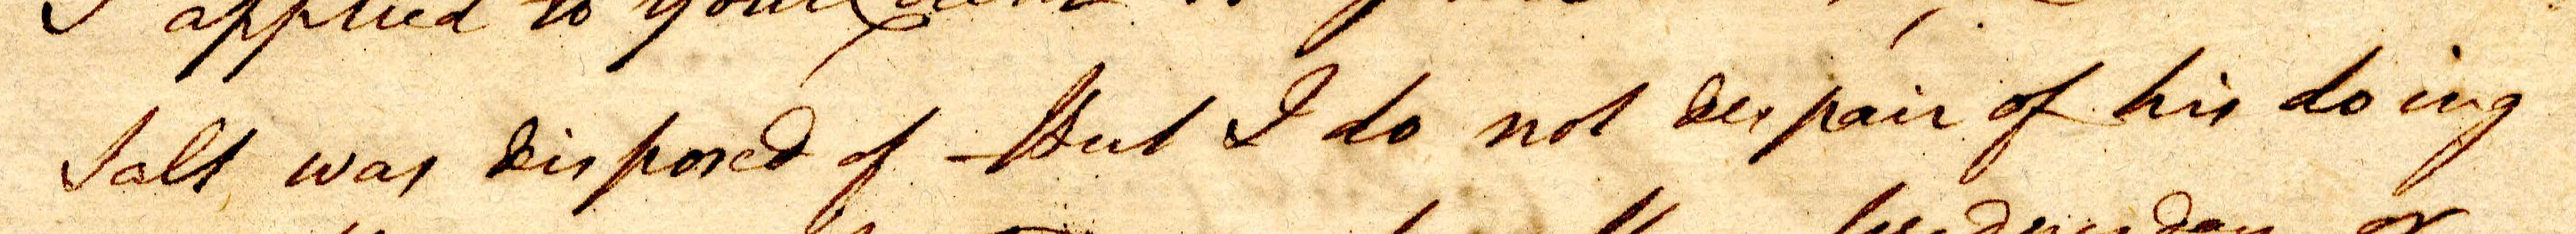salt was disposed of. But I do not despair of his doing
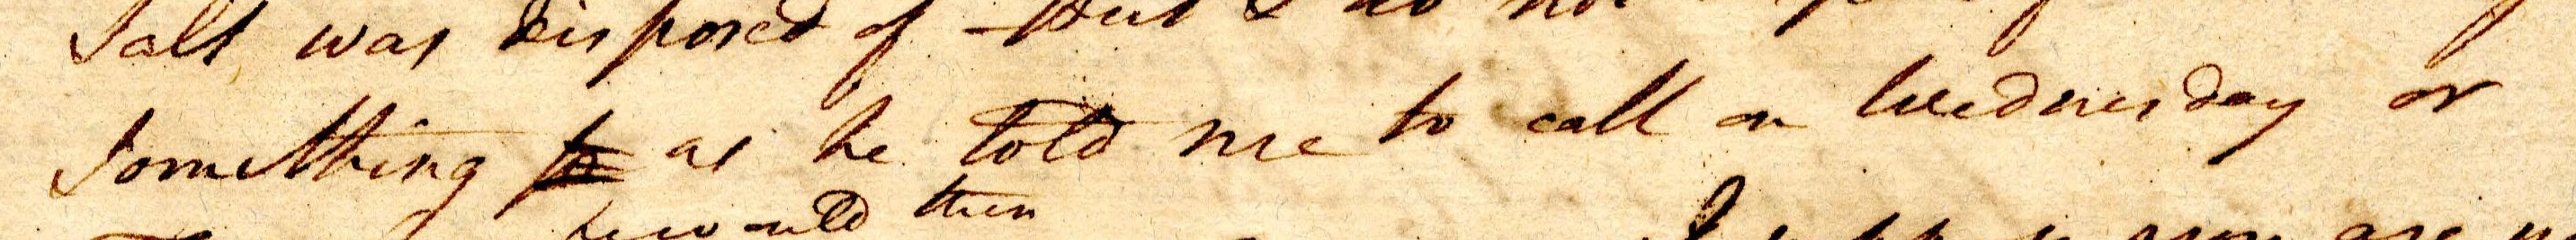something so as he told me to call on Wednesday or
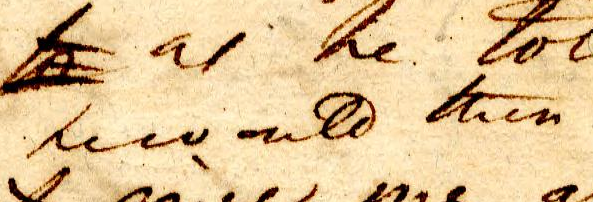here would then
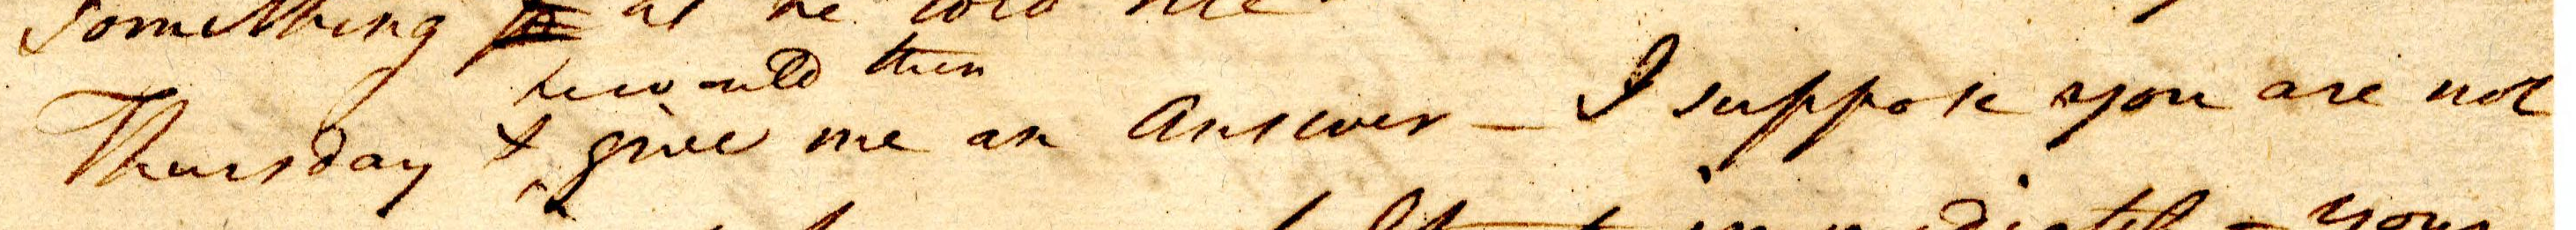Thursday & ^ give me an answer. I suppose you are not
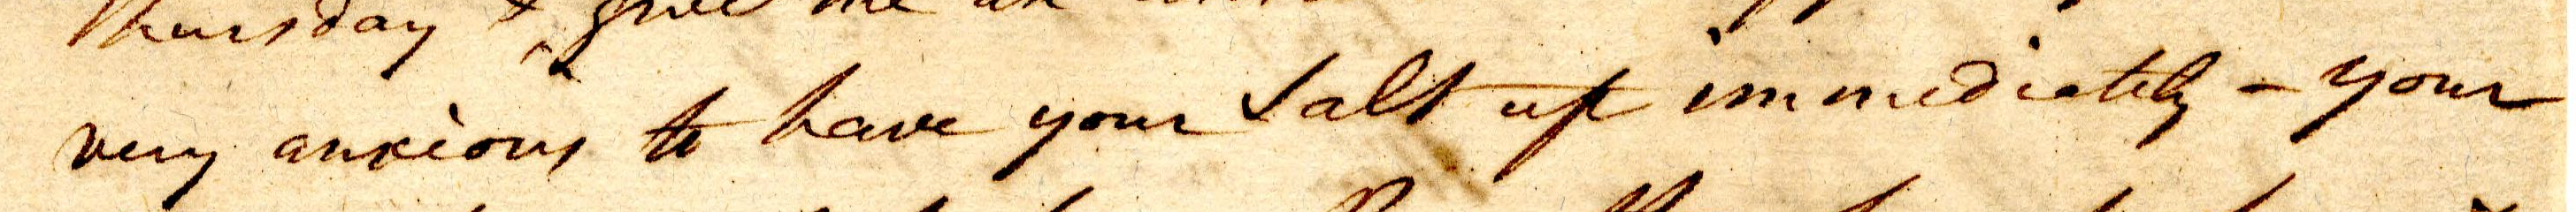very anxious to have your salt up immediately. your
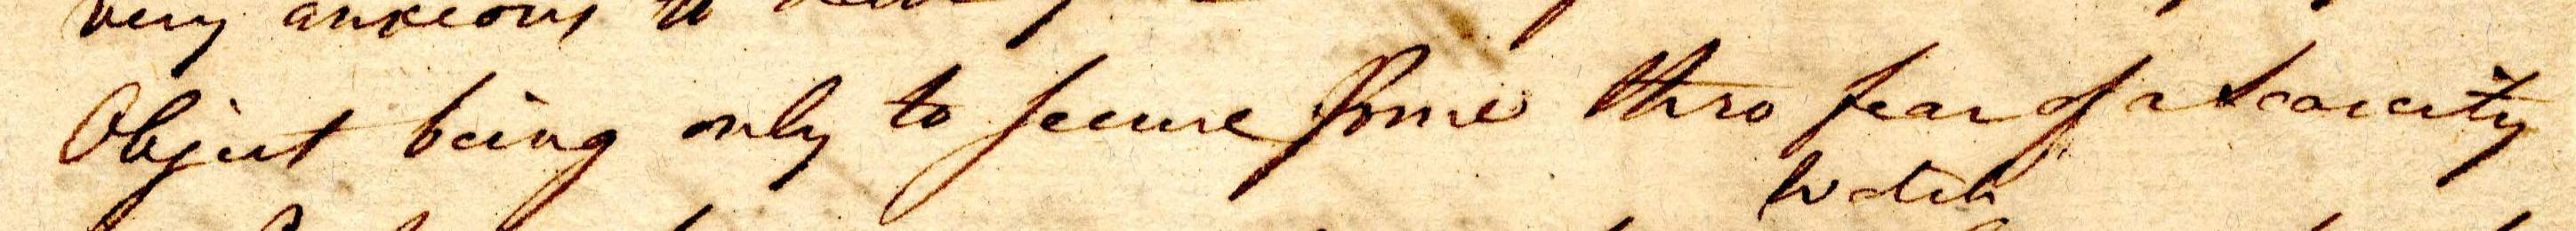Object being only to secure forces thro far of Scarcity
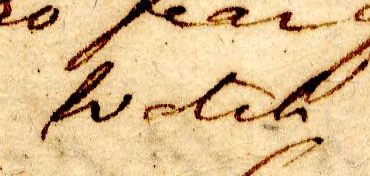Watch
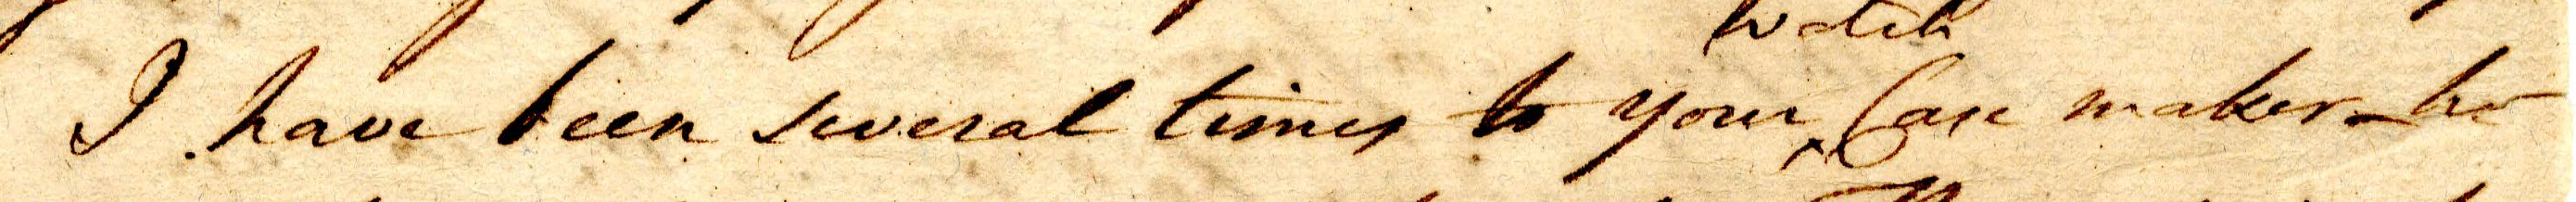I have been several times to your ^ Case maker. he
